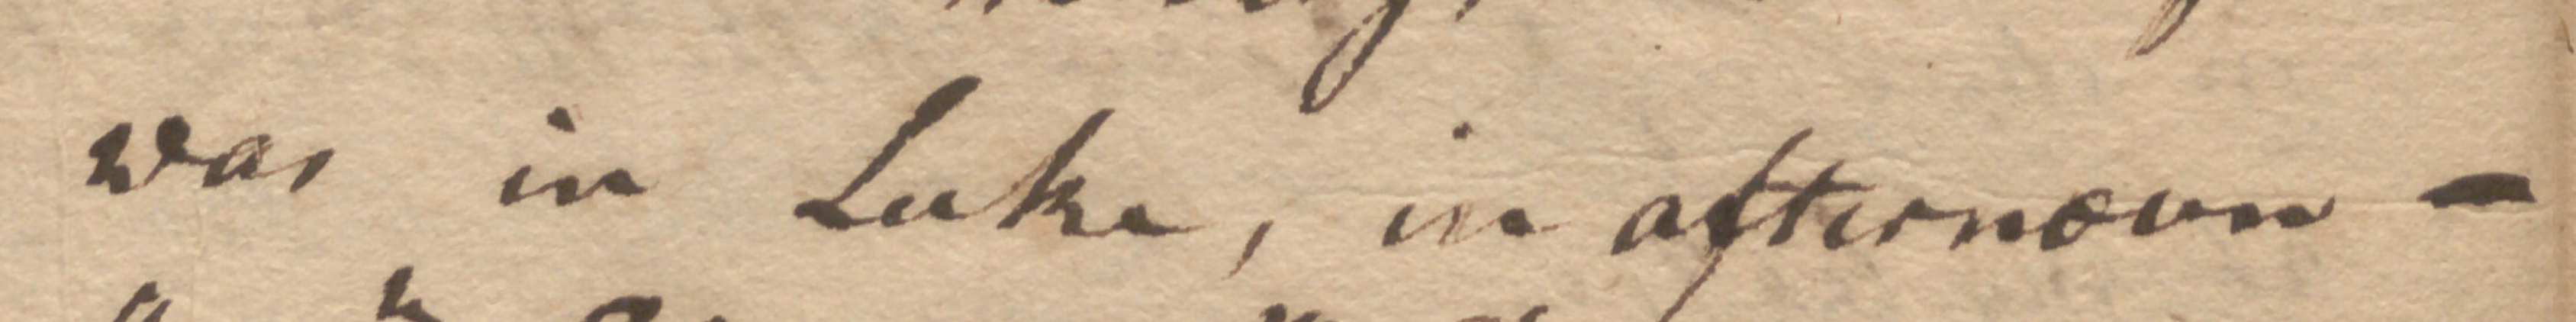was in Luke, in afternoon-
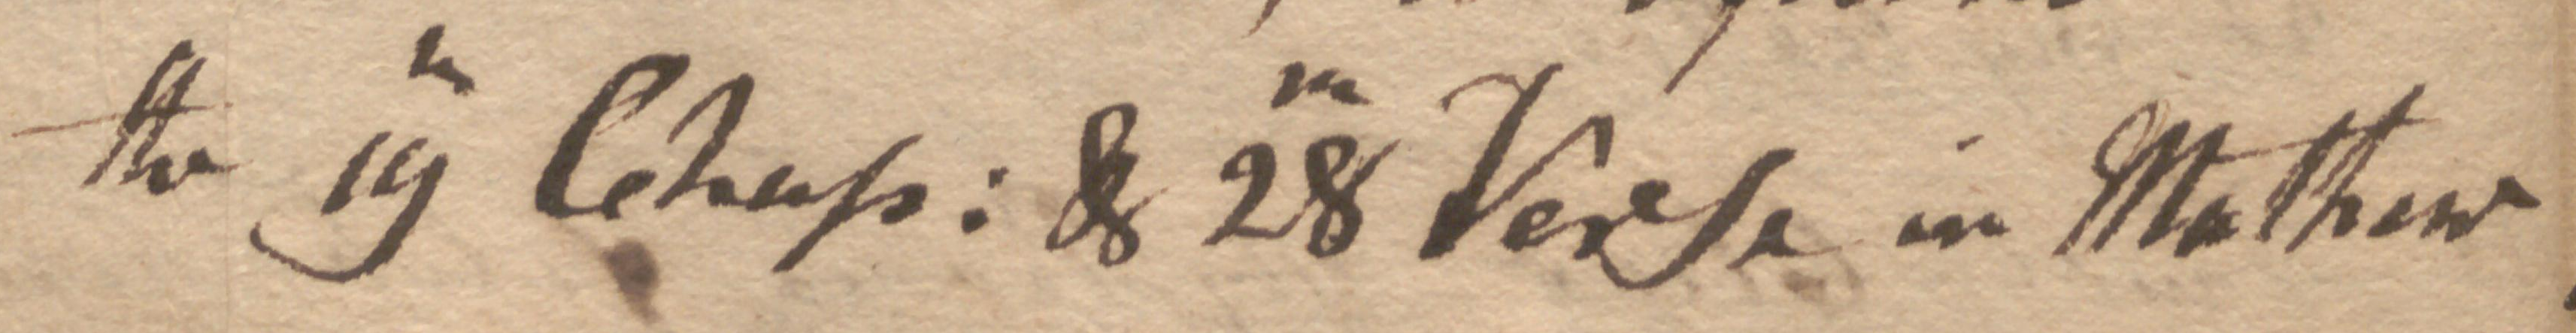the 19^th Chap: & 28^th Verse in Mathew
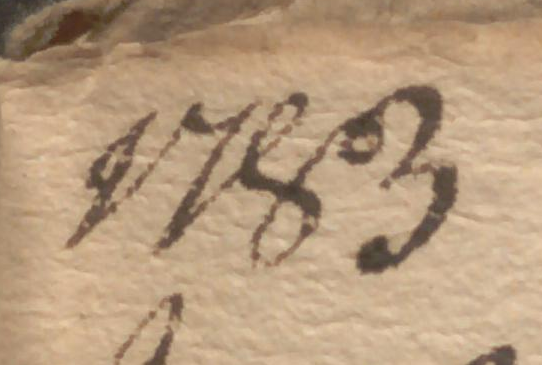1773
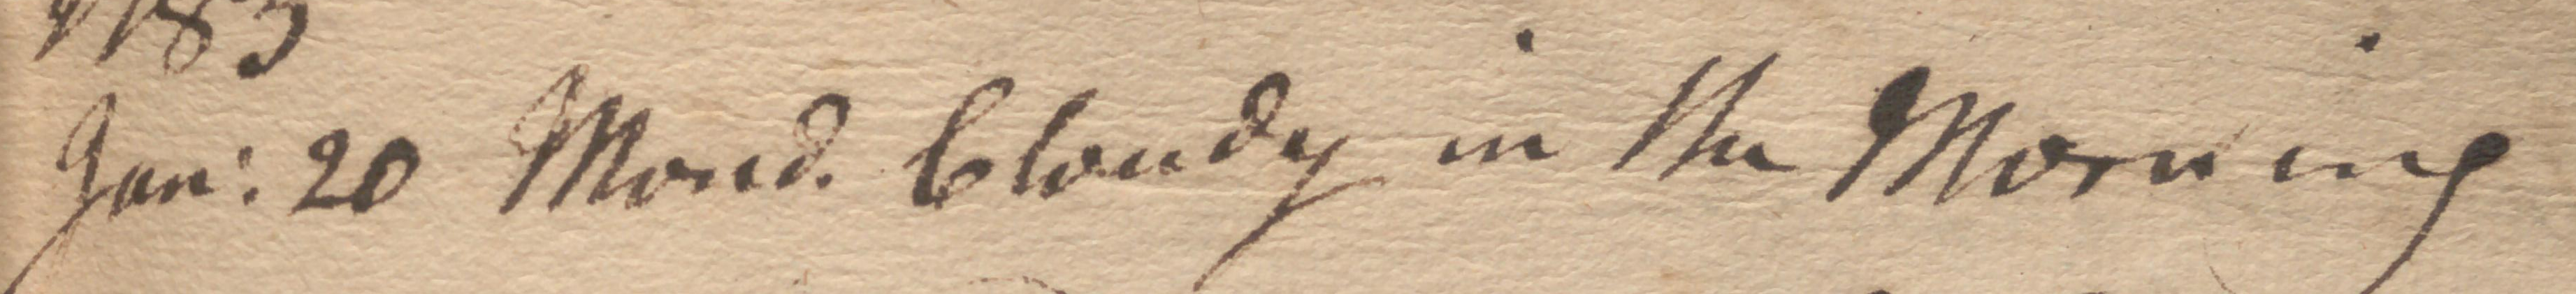Jan: 20 Mond. Cloudy in the Morning
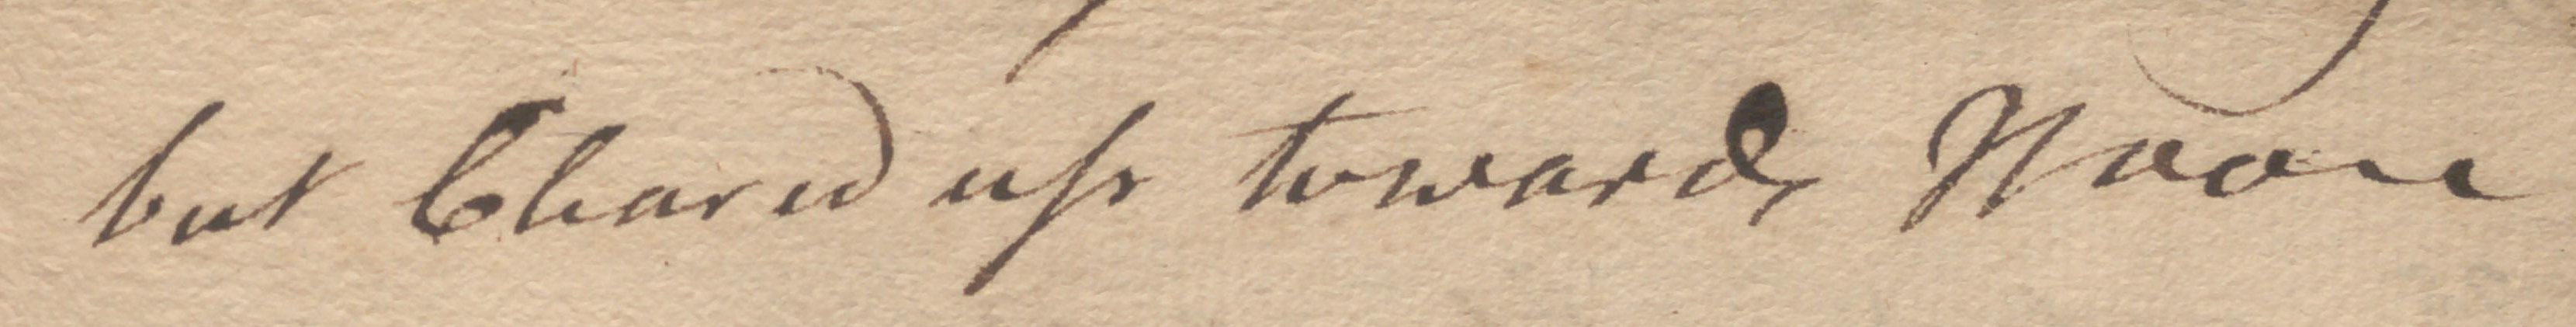but Cleared up towards Noon
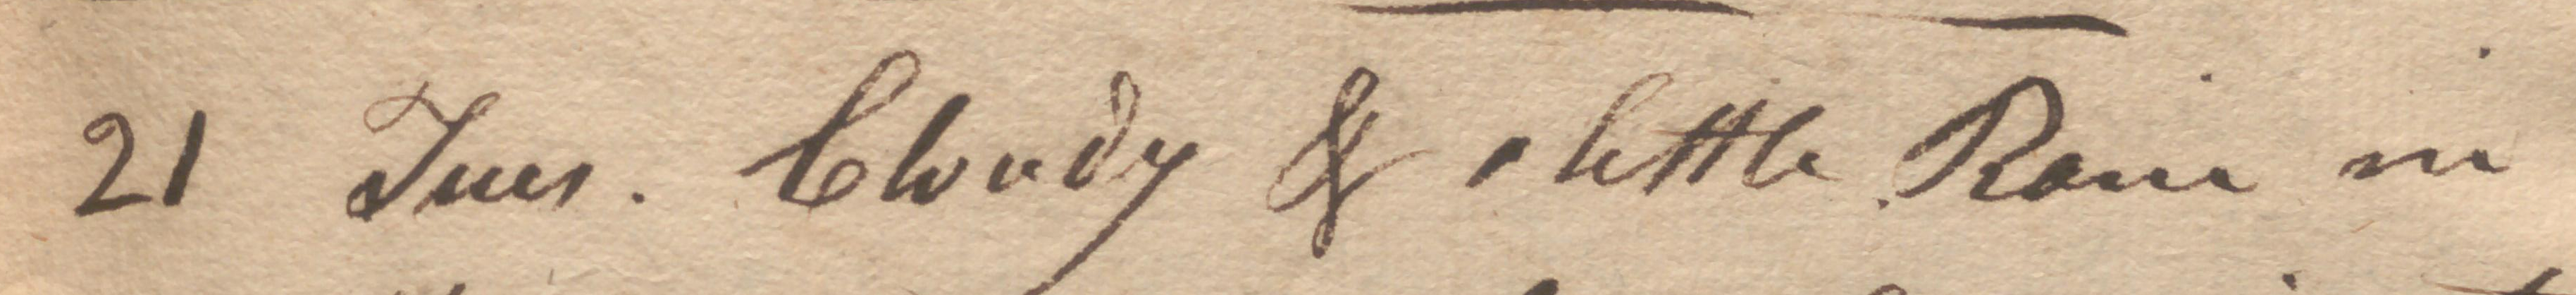21 Tues. Cloudy & a little Rain in
